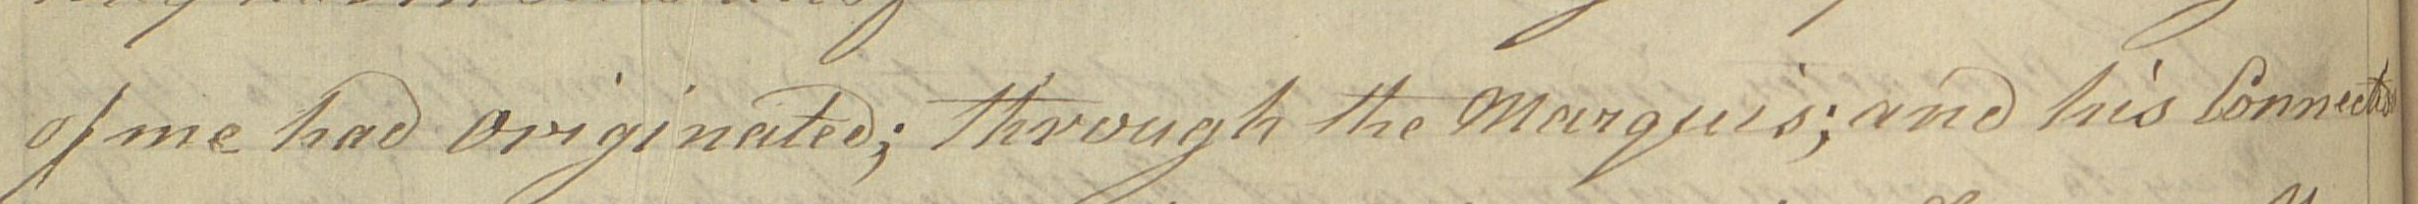of me had originated; through the Marquis; and his Connect-
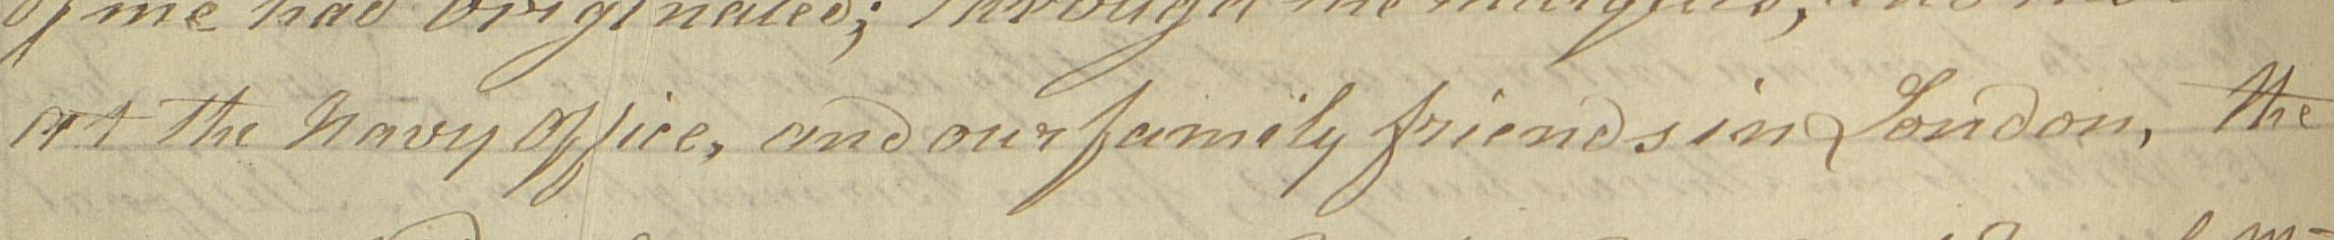at the Navy Office, and our family friends in London, the
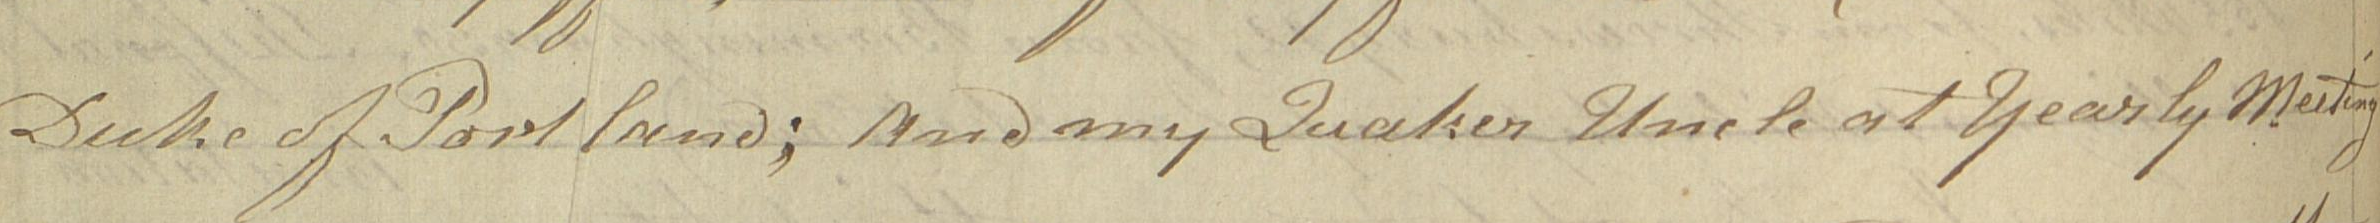Duke of Portland; And my Quaker Uncle at Yearly Meeting
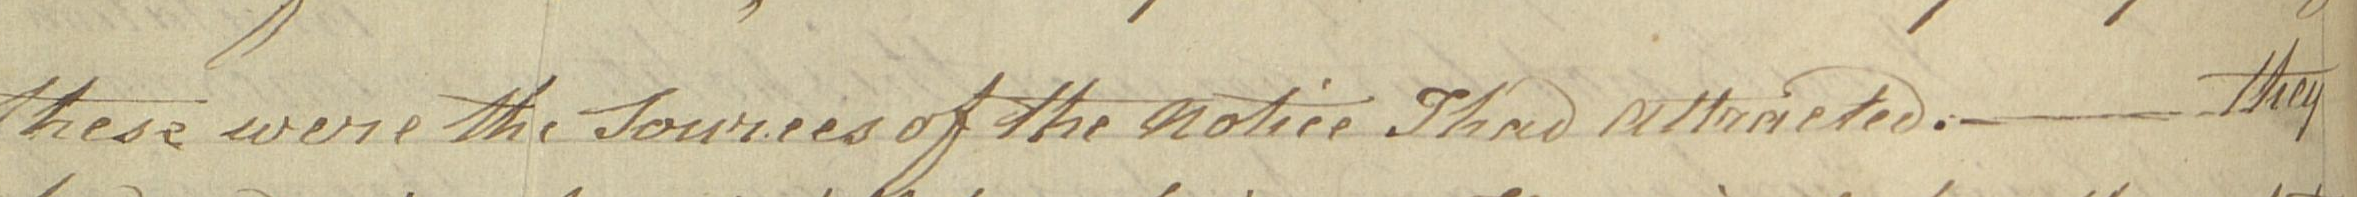these were the Sources of the Notice I had attracted. They
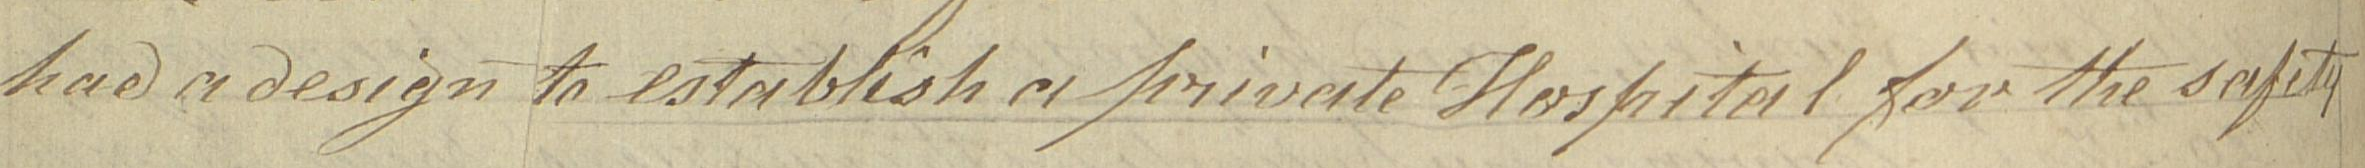had a design to establish a private Hospital for the safety
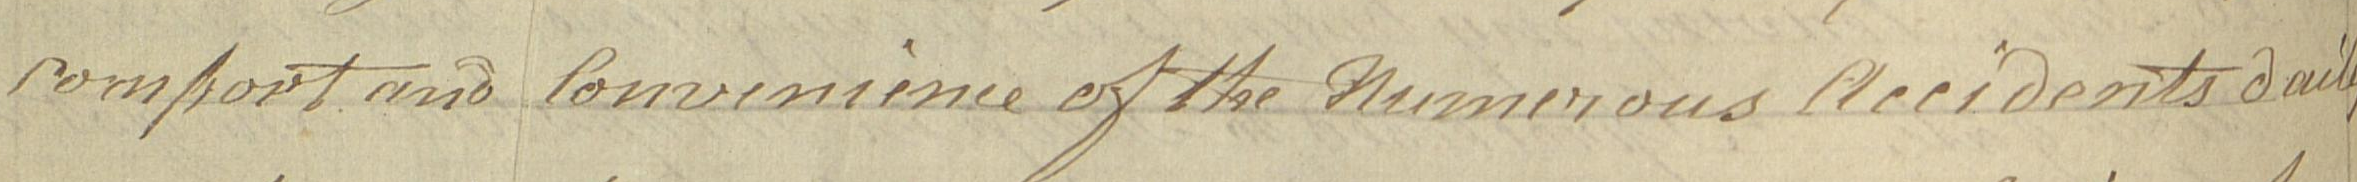comport and Convenience of the Numerous Accidents daily
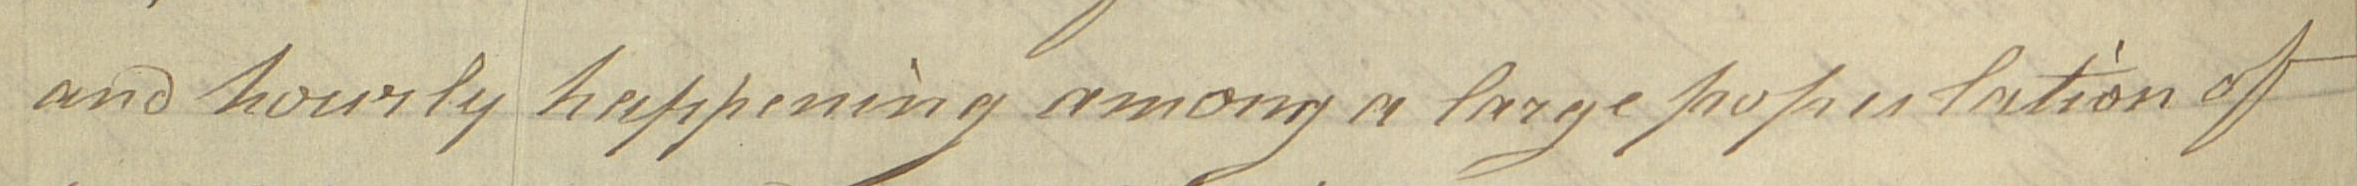and hourly happening among a large population of
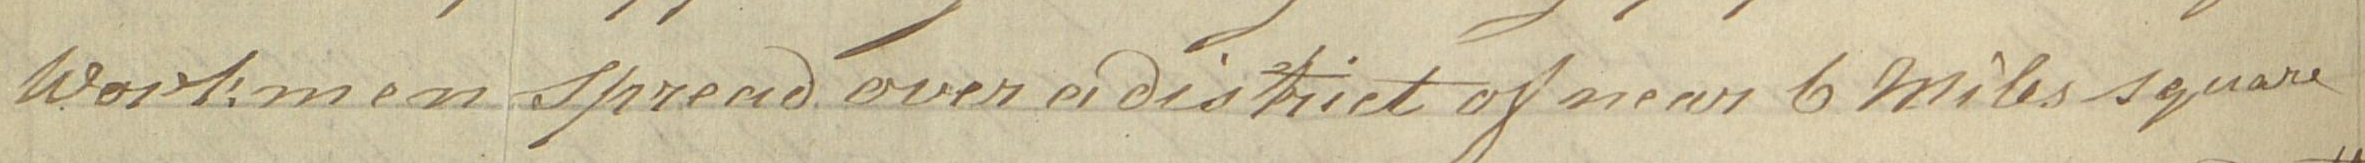Workmen spread over a district of near 6 Miles square
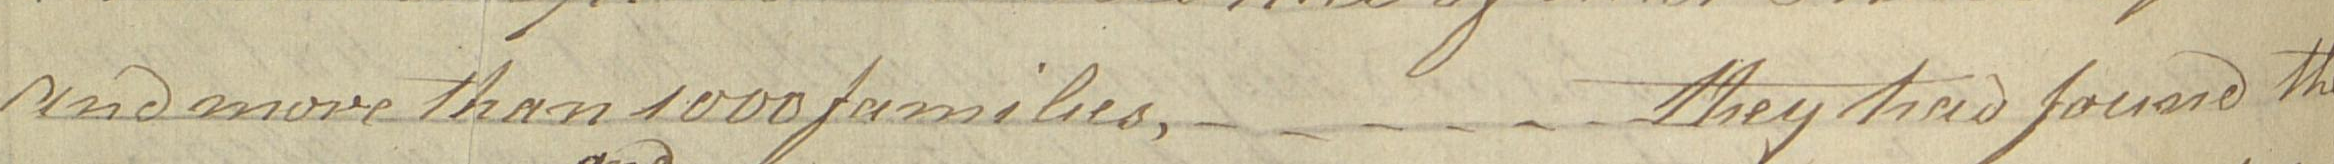and more than 1000 families, they had found the
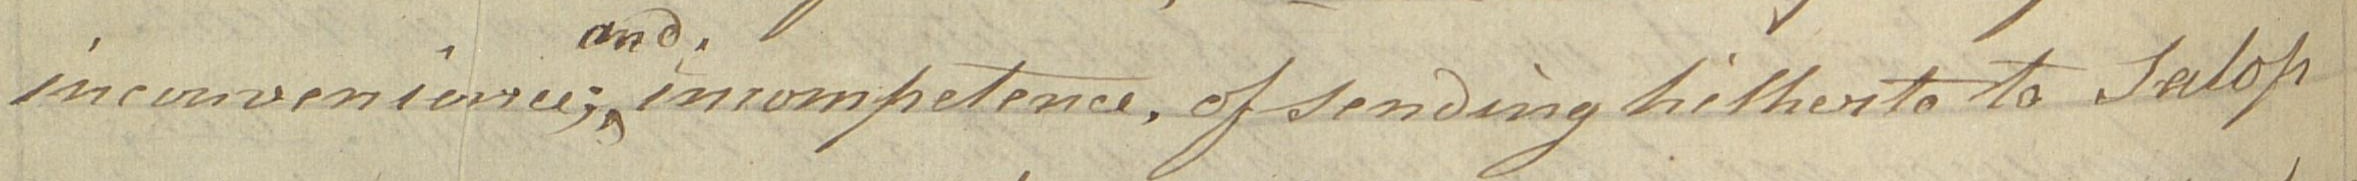inconvenience; ^ incompetence, of sending hitherto to Salop
